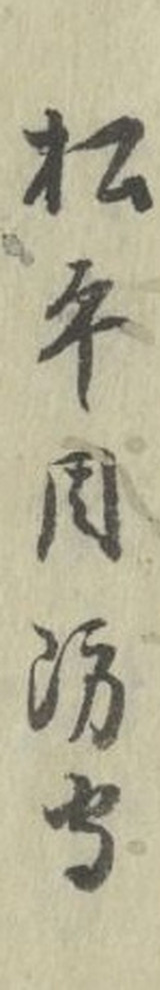大紋松平周防守
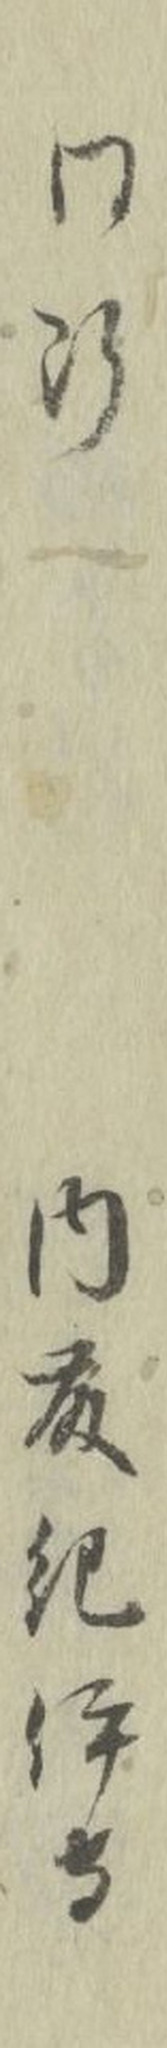同断内藤紀伊守
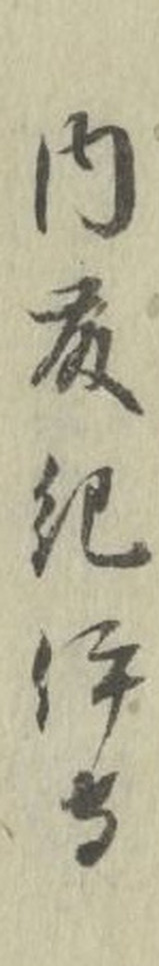同断内藤紀伊守
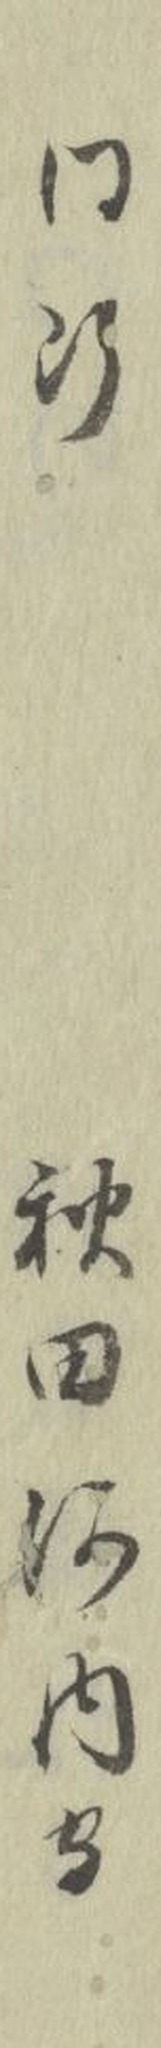同断秋田河内守
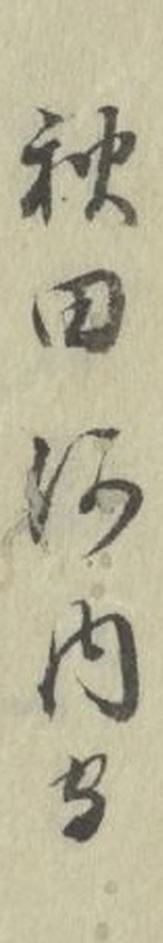同断秋田河内守
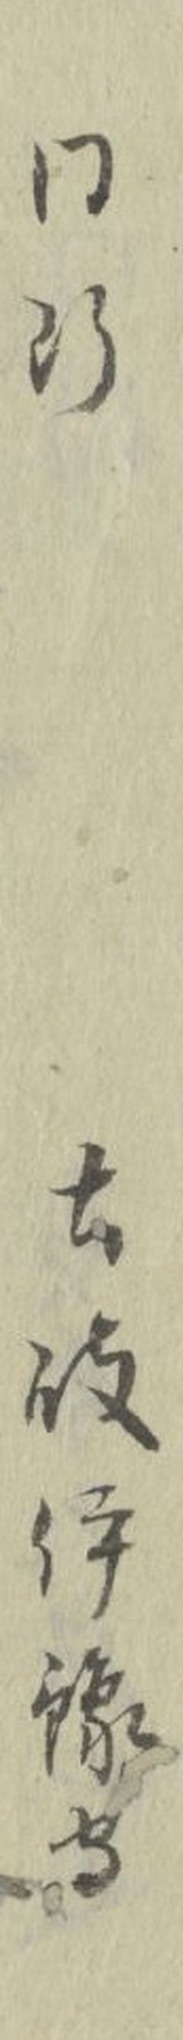同断土岐伊予守
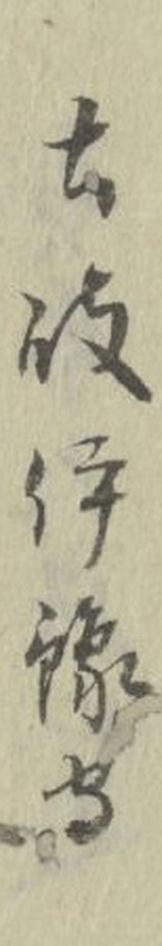同断土岐伊予守
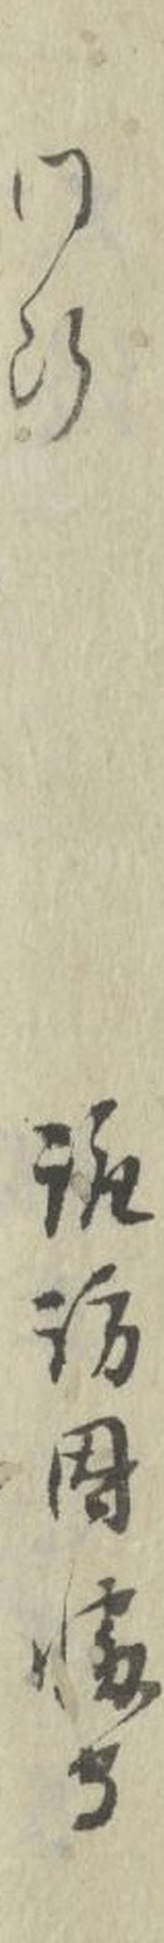同断諏訪因幡守
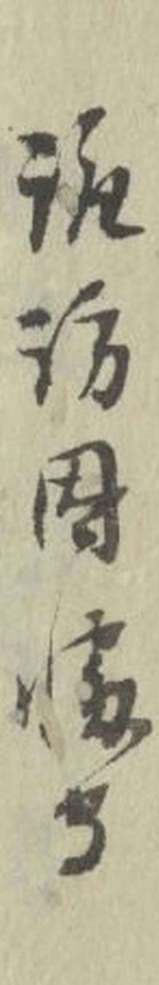同断諏訪因幡守
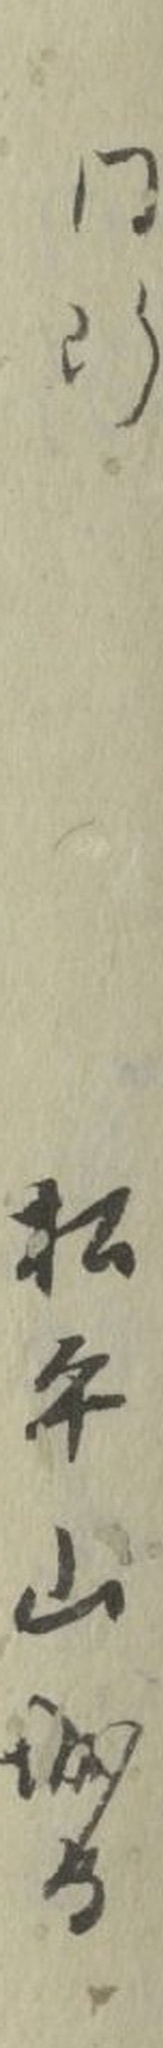同断松平山城守
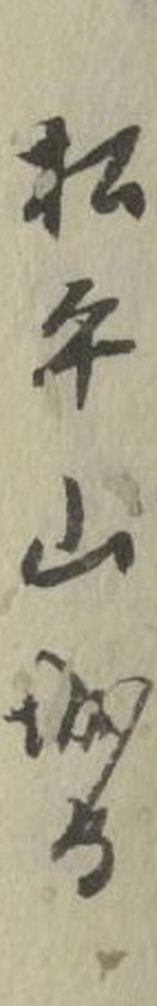同断松平山城守
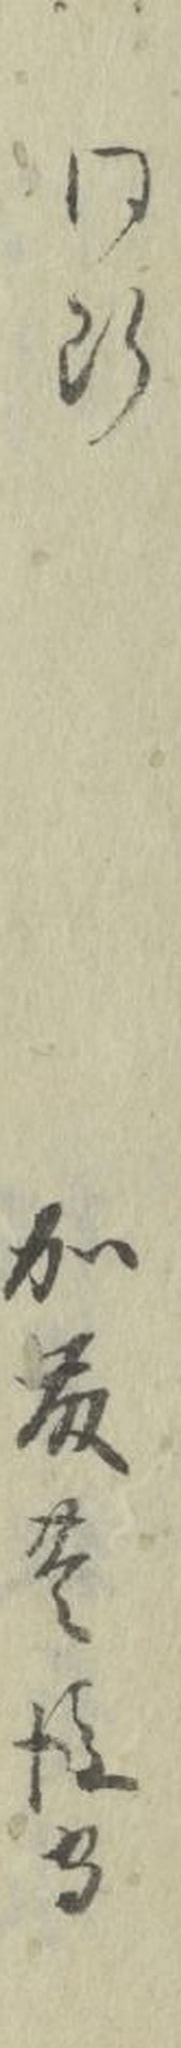同断加藤豊後守
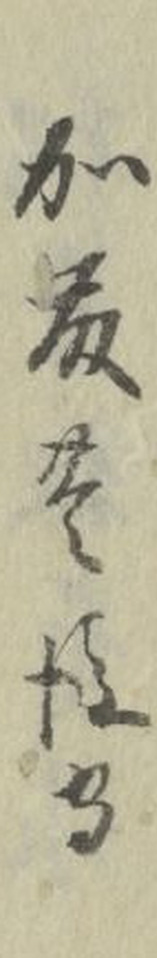同断加藤豊後守
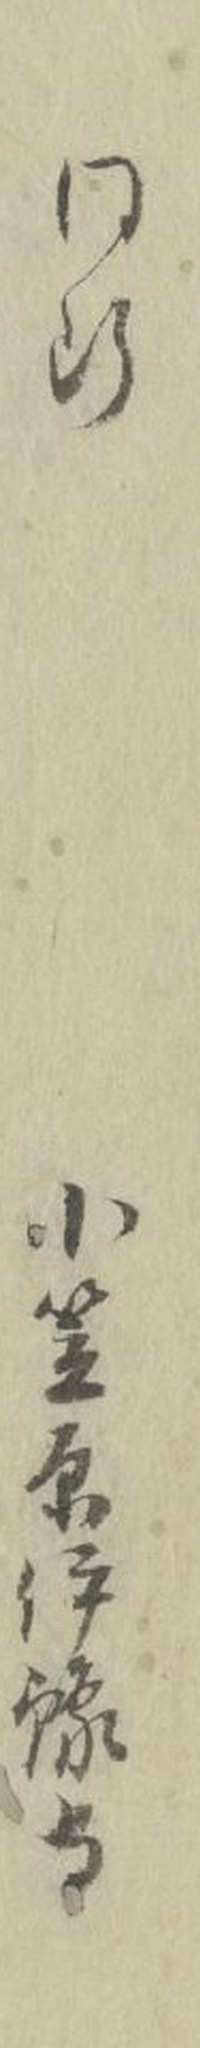同断小笠原伊予守
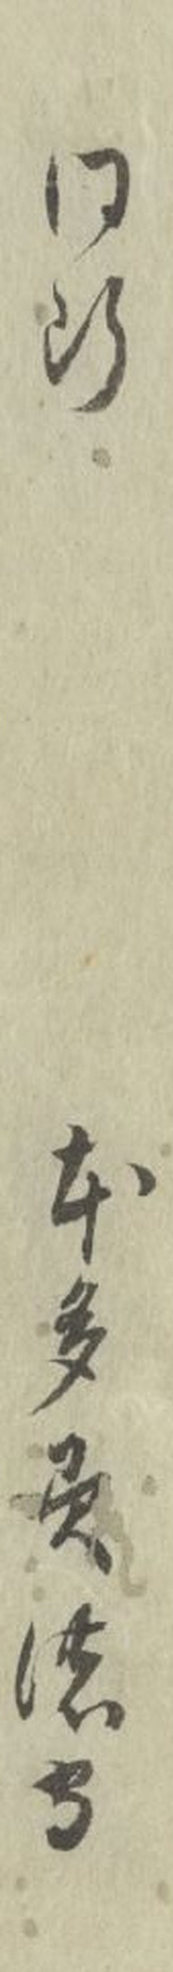同断本多美濃守
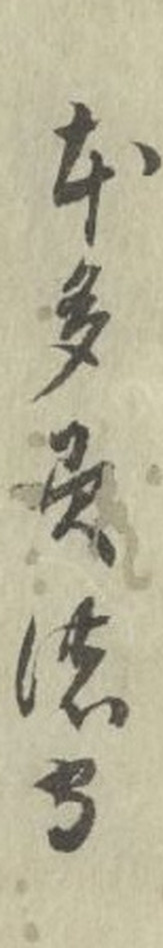同断本多美濃守
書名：琉球来朝記 自一至七
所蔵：University of the Ryukyus Library
